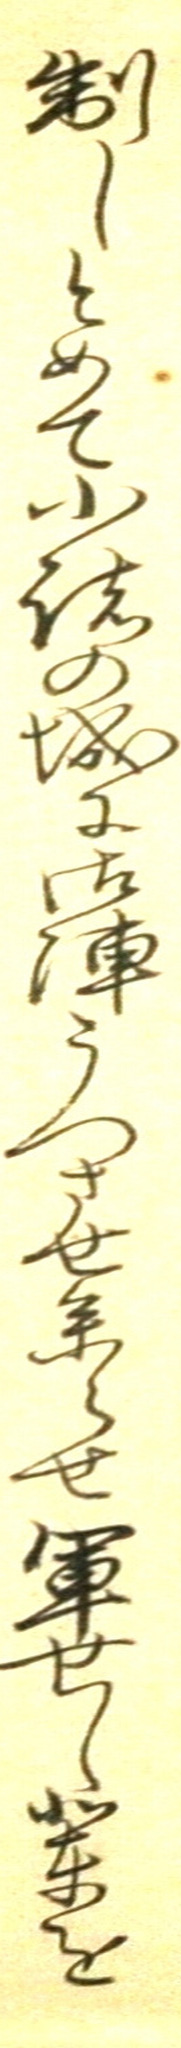制しとめて小諸の城に御陣うつさせ参らせ軍せし輩を
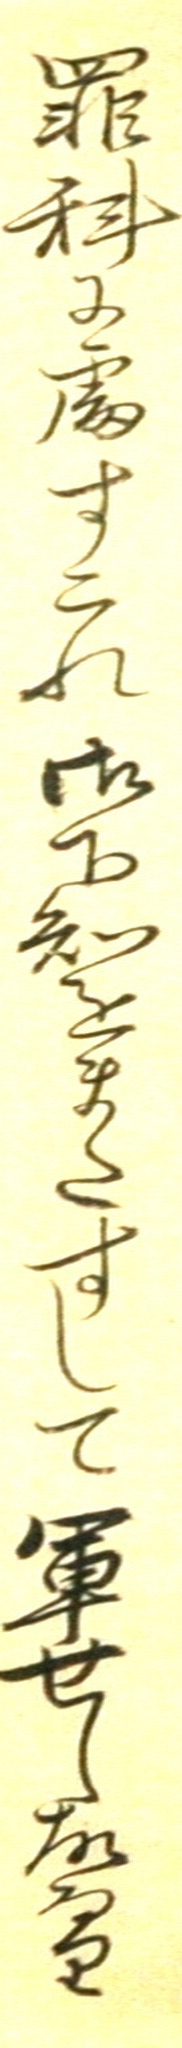罪科に処すこれ御下知をまたすして軍せし故なり
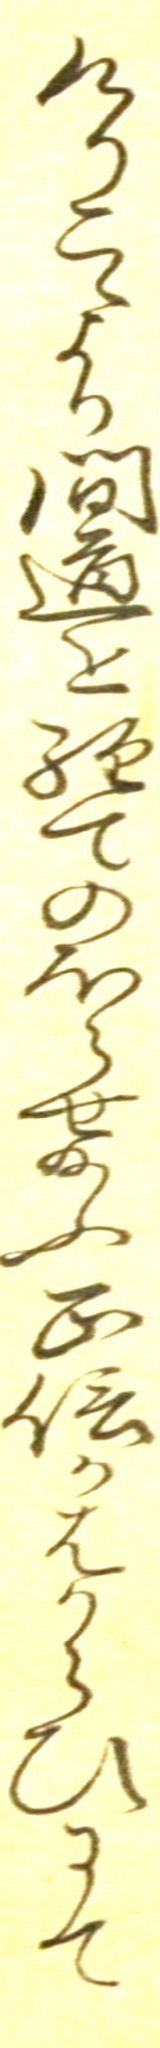けりこゝより間道を経てのほらせ給ふ正信かはからひにて

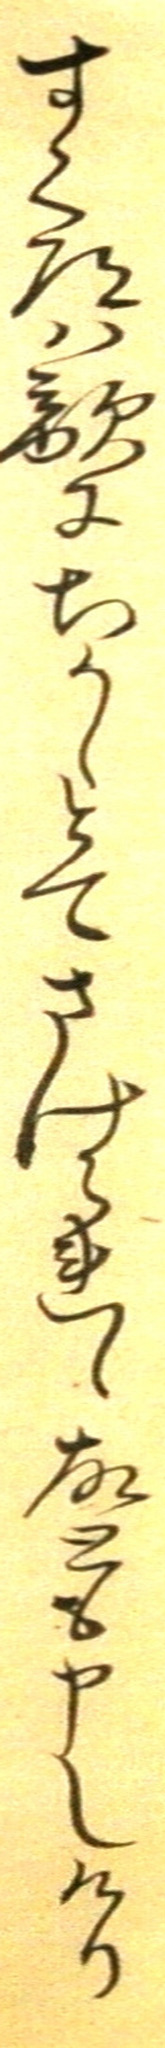すく道は敵にちかしとてさけられし故とも申しけり
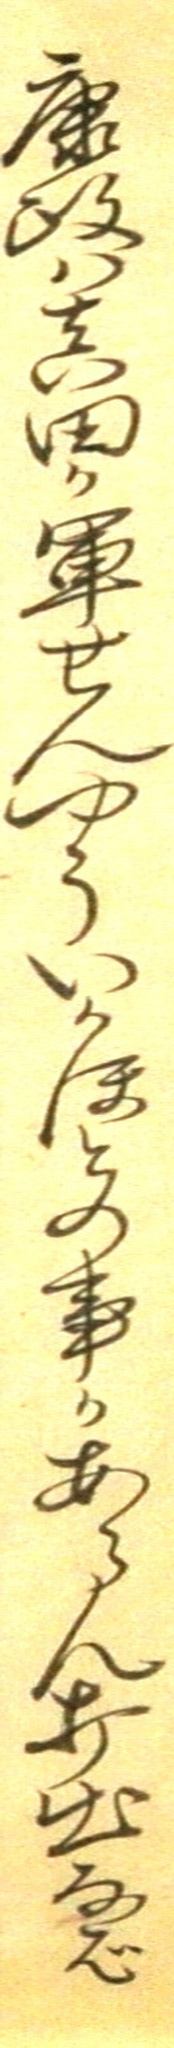康政は真田か軍せんやういかほとの事かあらん打出なば
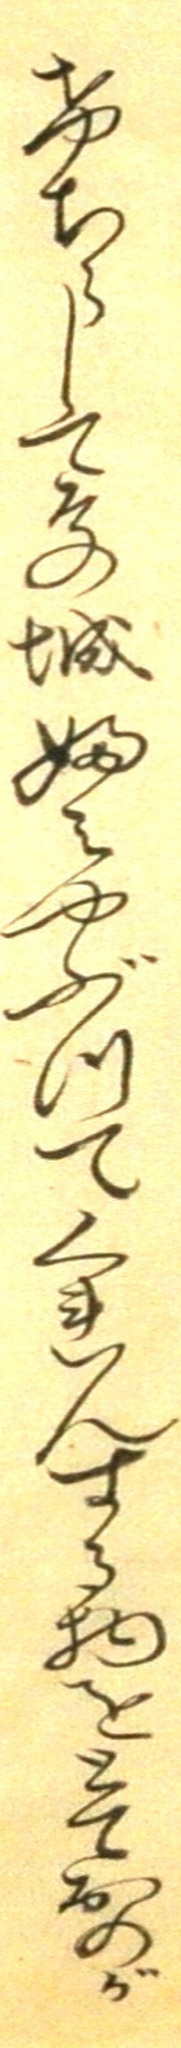けちらしてその城ふみやぶつてくれんする物をとておのが
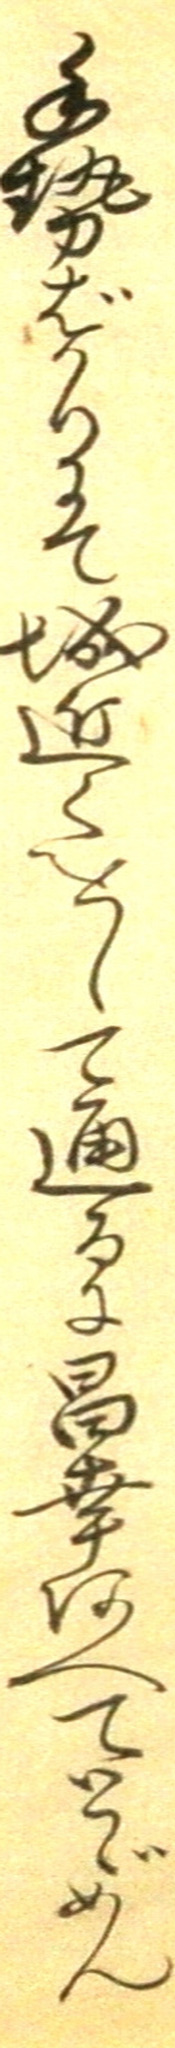手勢ばかりにて城近くをして通るに昌幸あへてとゞめん
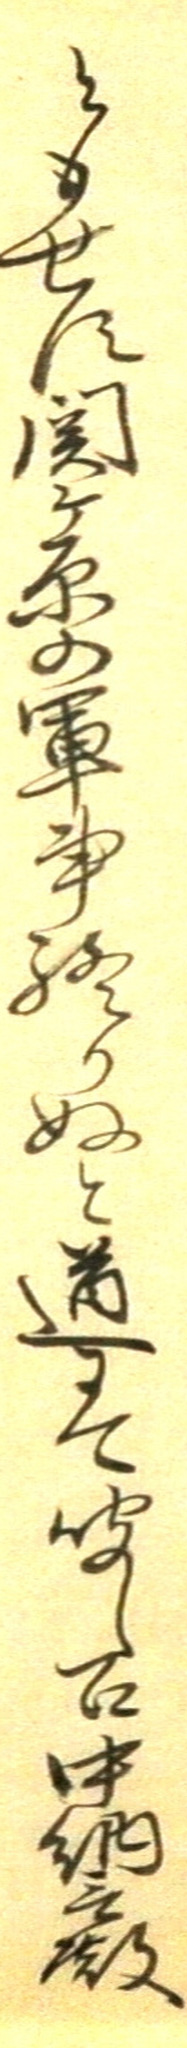ともせす関ヶ原の軍事終りぬと道にて聞し召中納言殿
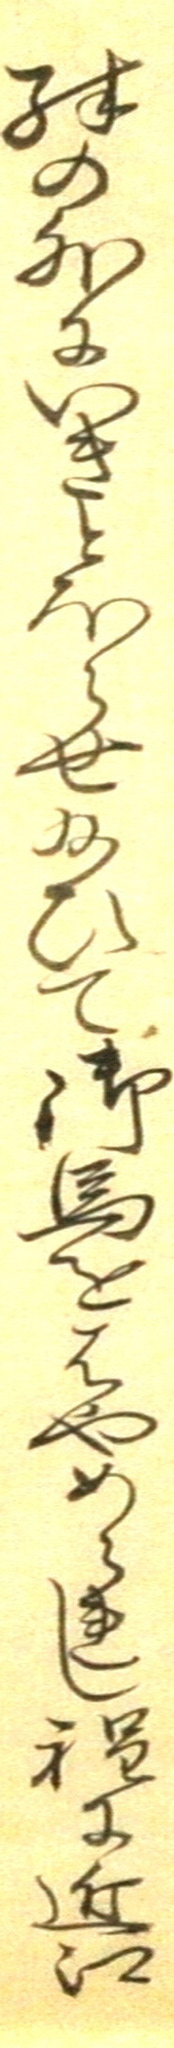殊の外にいきとほらせ給ひて御馬をはやめられし程に近江
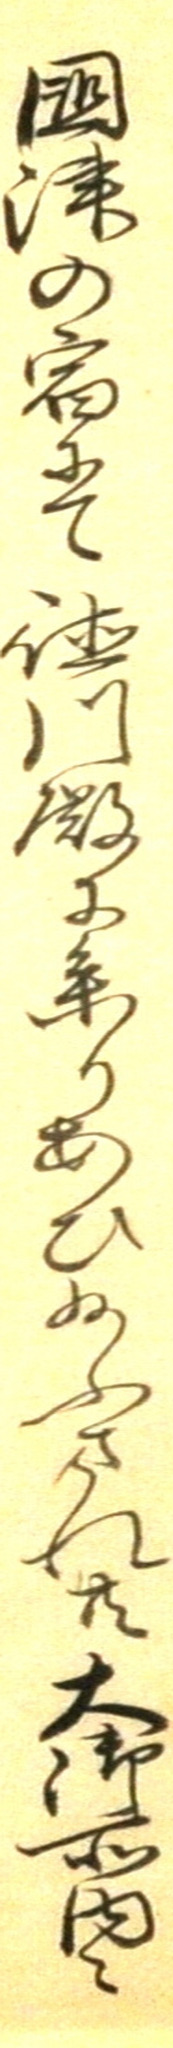国津の宿にて徳川殿に参りあひ給ふされ共大御所内々
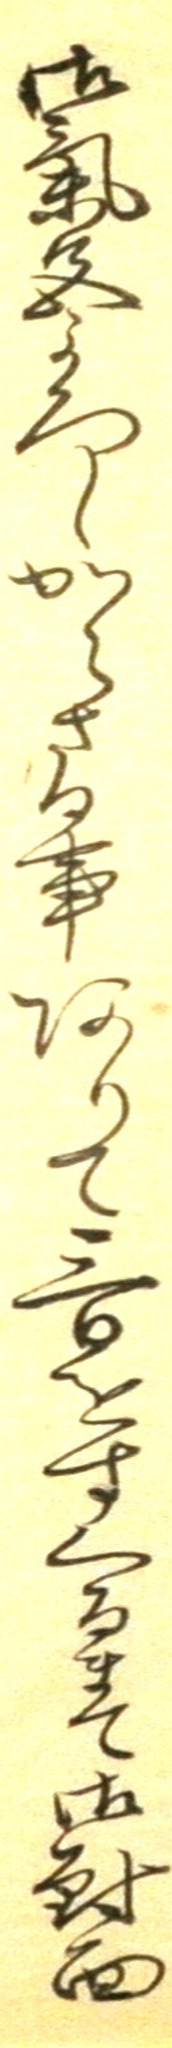御気色よろしからさる事ありて三日をすくるまて御対面
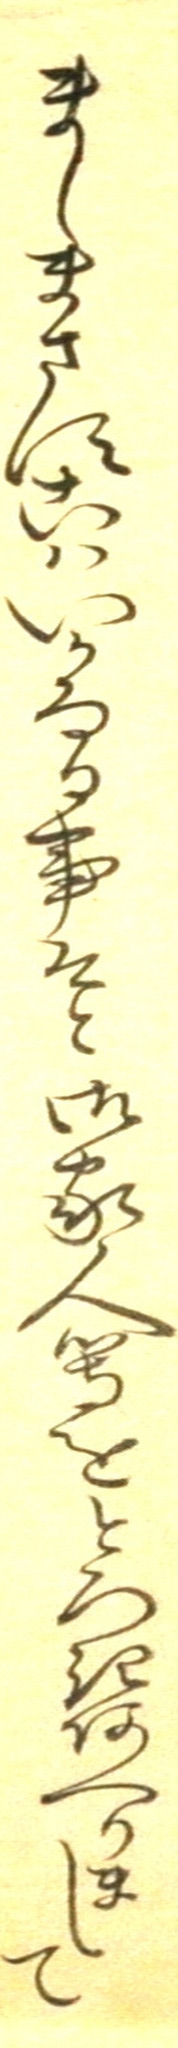ましまさすこはいかなる事そと御家人等をとろきあへりまして
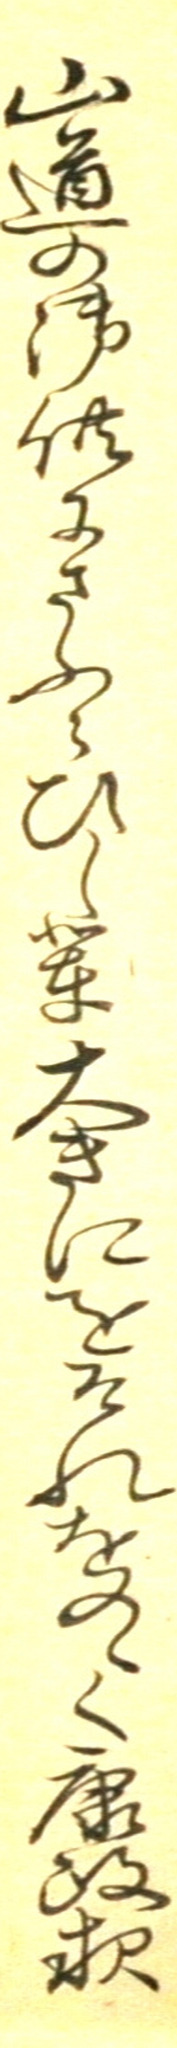山道の御供にさふらひし輩大きにをそれをのゝく康政夜
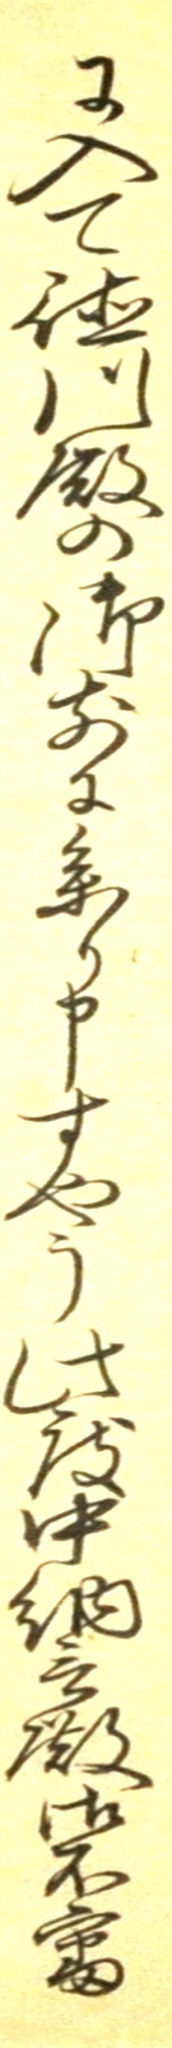に入て徳川殿の御前に参り申すやう此度中納言殿御不審
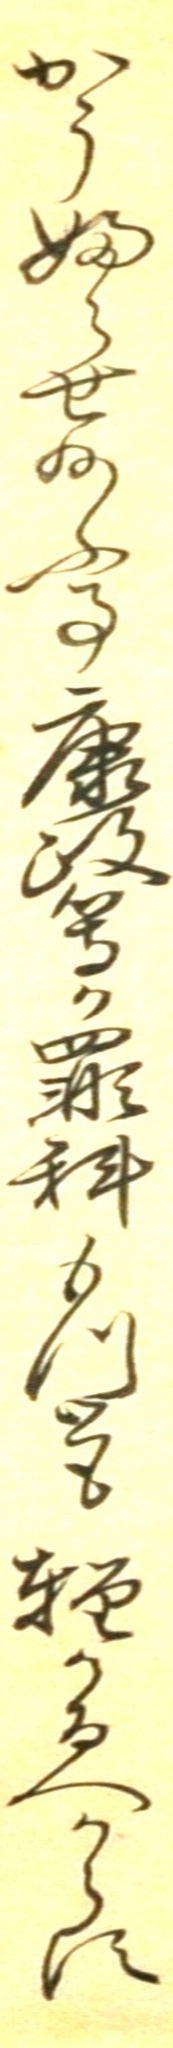かうふらせ給ふ事康政等か罪科もつとも軽かるへからす
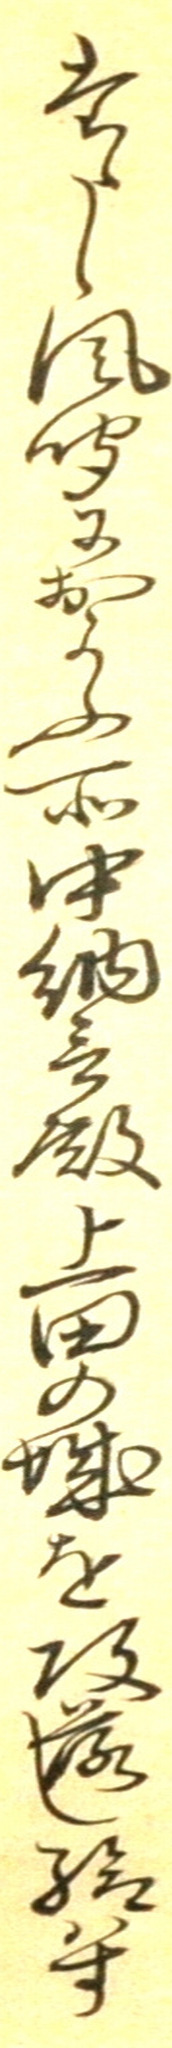たゝし風聞におよふ所中納言殿上田の城を攻落し給はす
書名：藩翰譜（四・上）
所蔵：伊那市立高遠町図書館・合同会社AMANE
